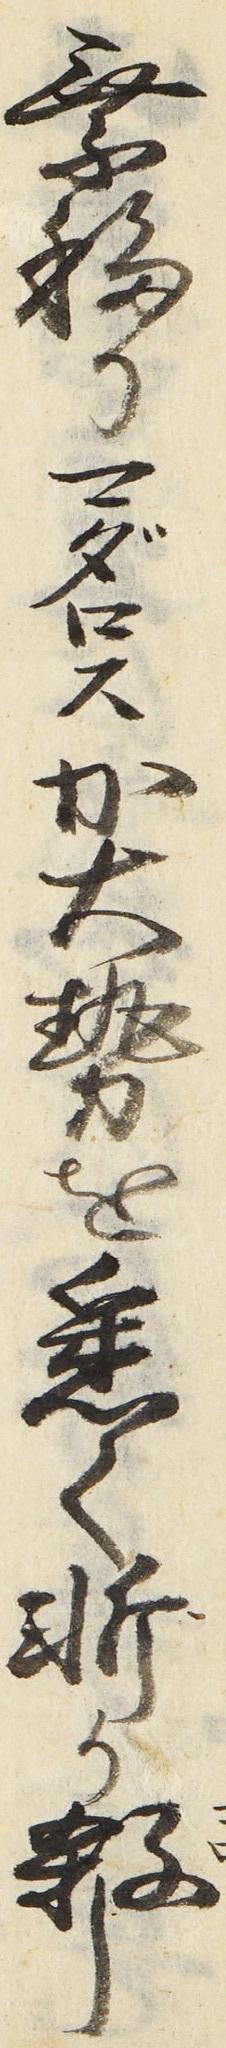乗移りマダロスか大勢を悉く斬り殺し
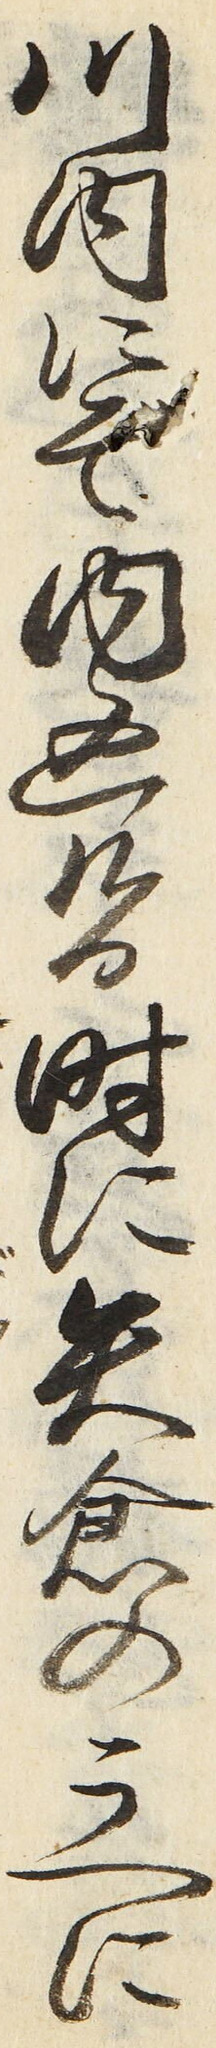川内にぞ内込ける時に矢倉のうへに
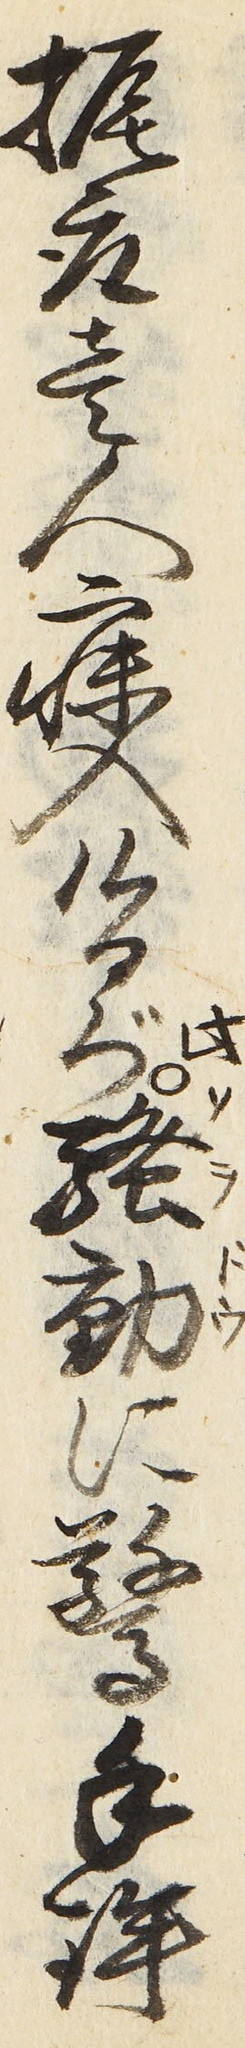梶取壱人寝入けるが此騒動に驚手鉾
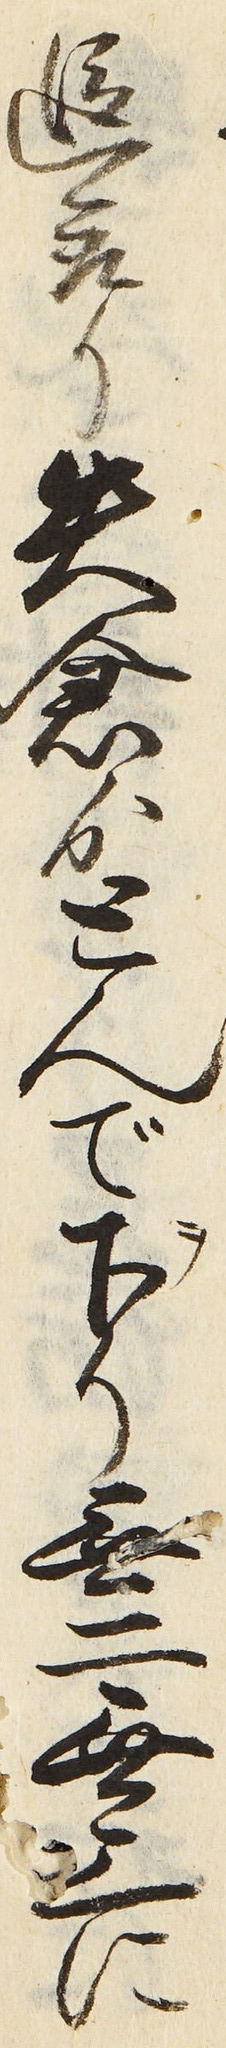追取り矢倉ゟとんで下り無二無三に
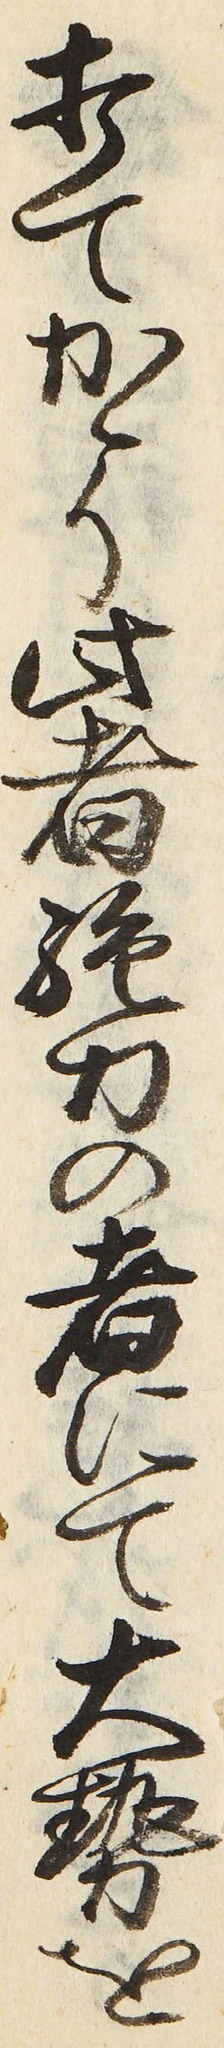打てかゝり此者強力の者にて大勢を
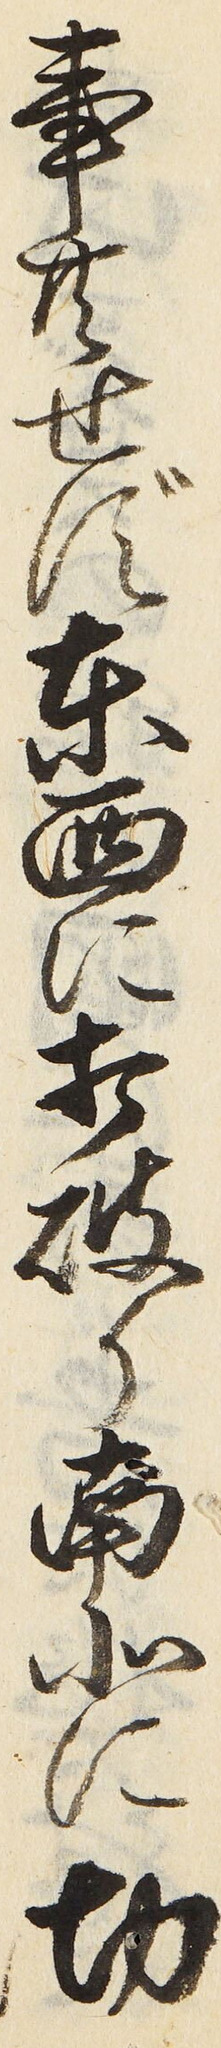事共せず東西に打破り南北に切
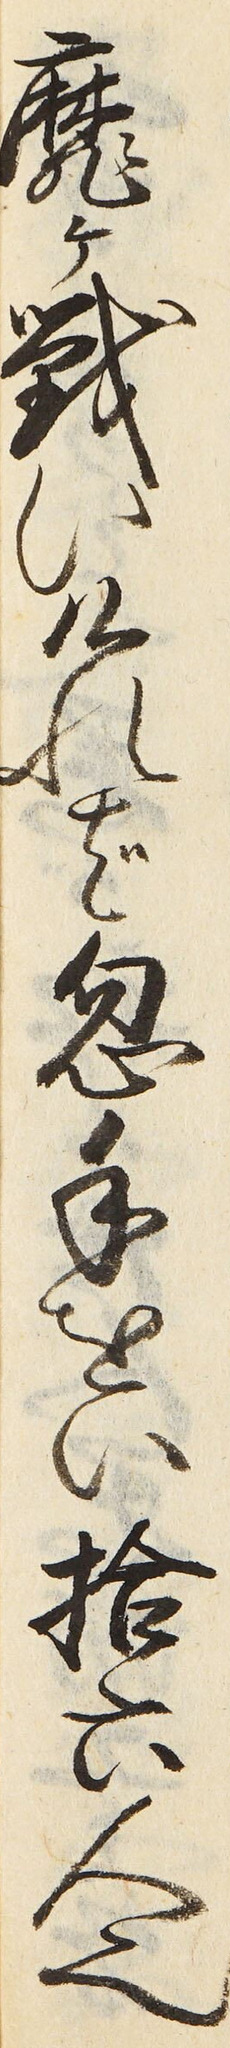靡け戦ひければ忽手をい拾六人也
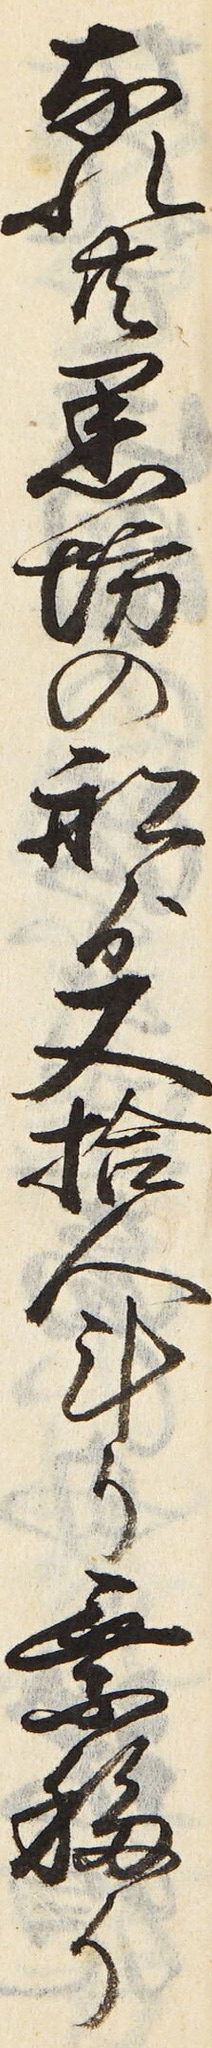なれ共黒坊の船ゟ又拾人計り乗移り
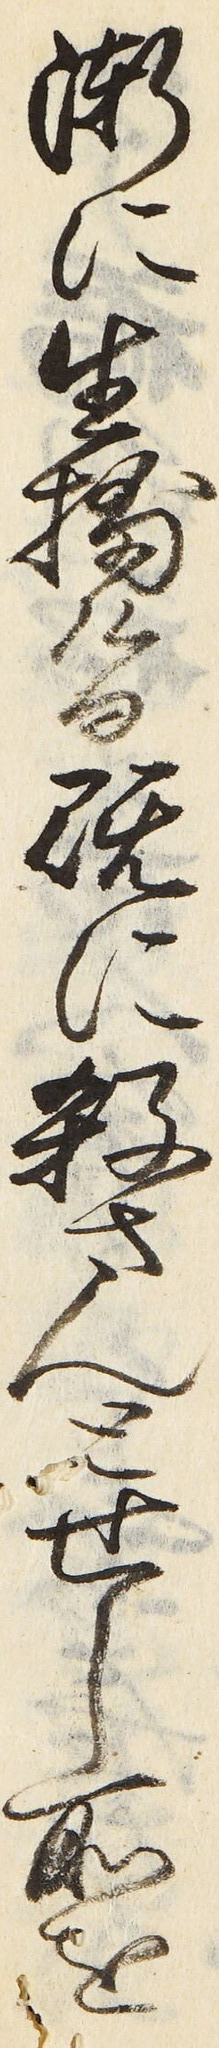漸に生捕ける既に殺さんとせし所を
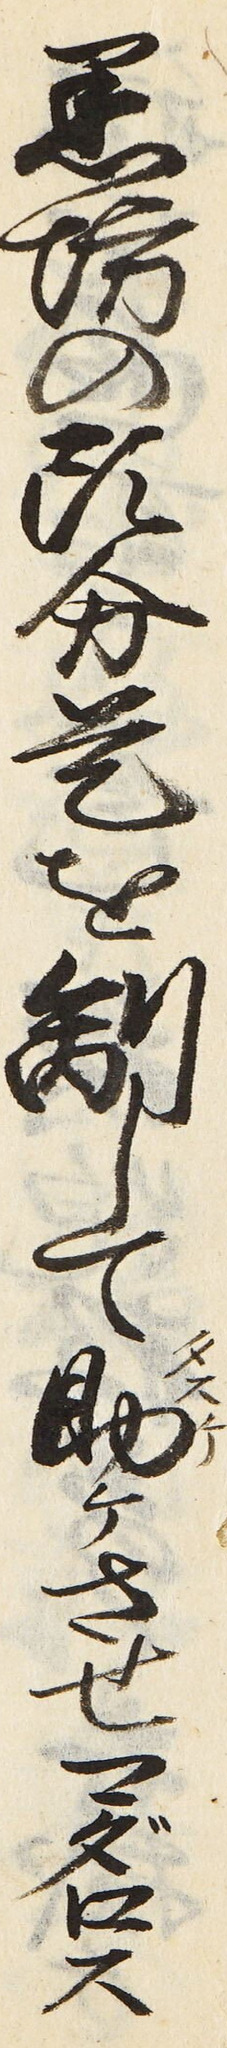黒坊の頭分是を制して助けさせマダロス
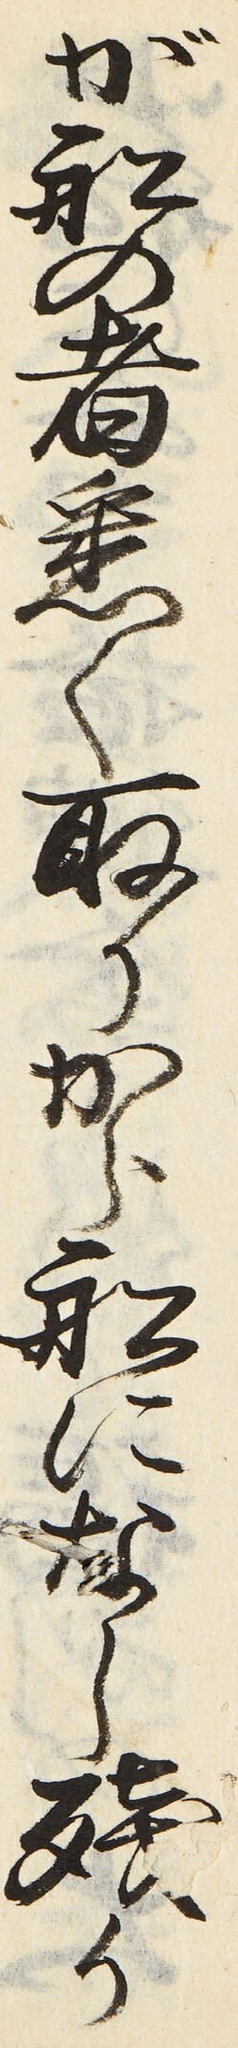が船の者悉く取りから船になし残り
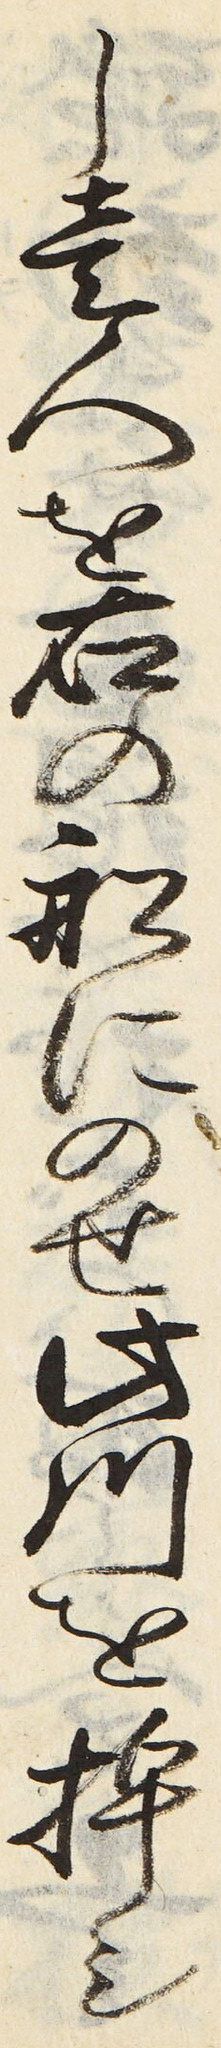し壱人を右の船にのせ此川を押し
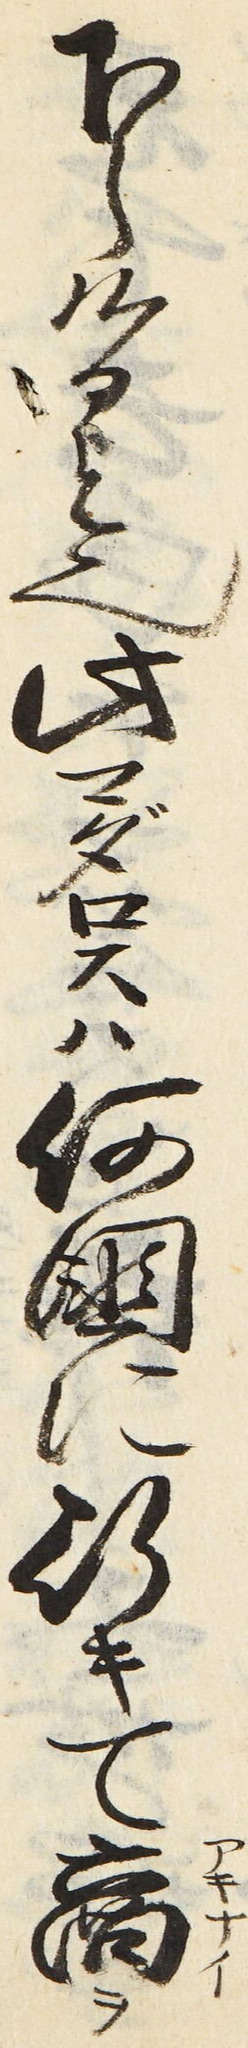下しけると也此マダロスは何国に行きて商を
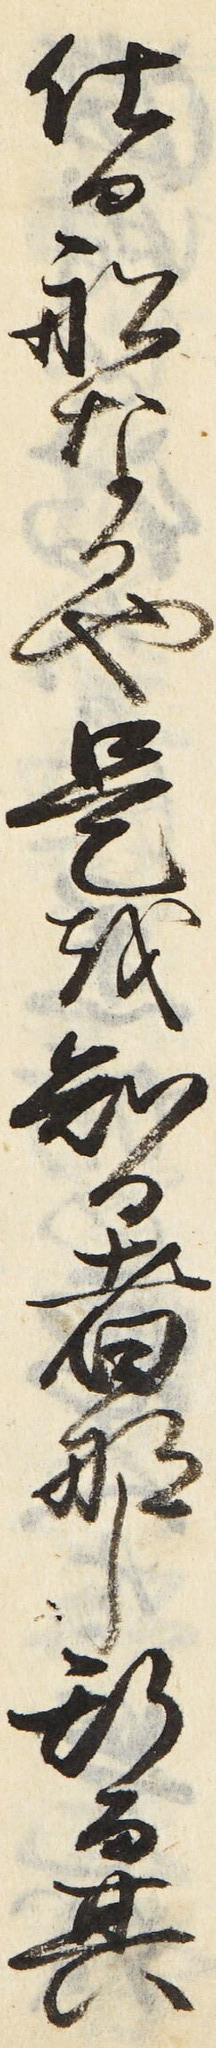仕る船なるや是を知る者なし斯而其
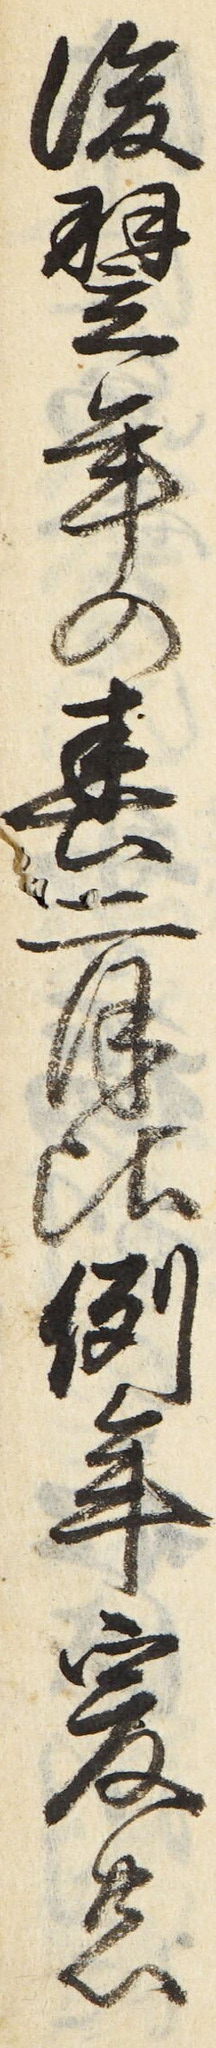後翌年の春二月頃例年爰の

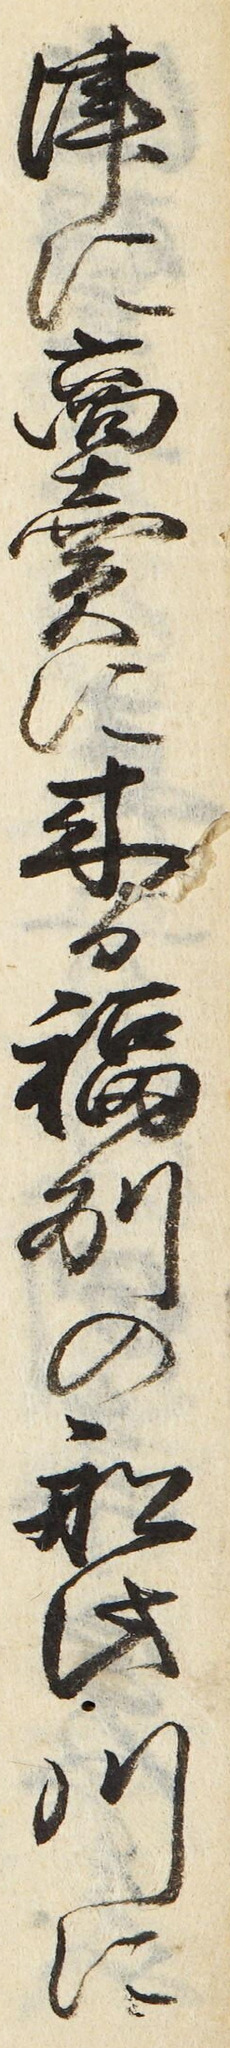津に商売に来る福州の船此川に
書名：華夷九年録
